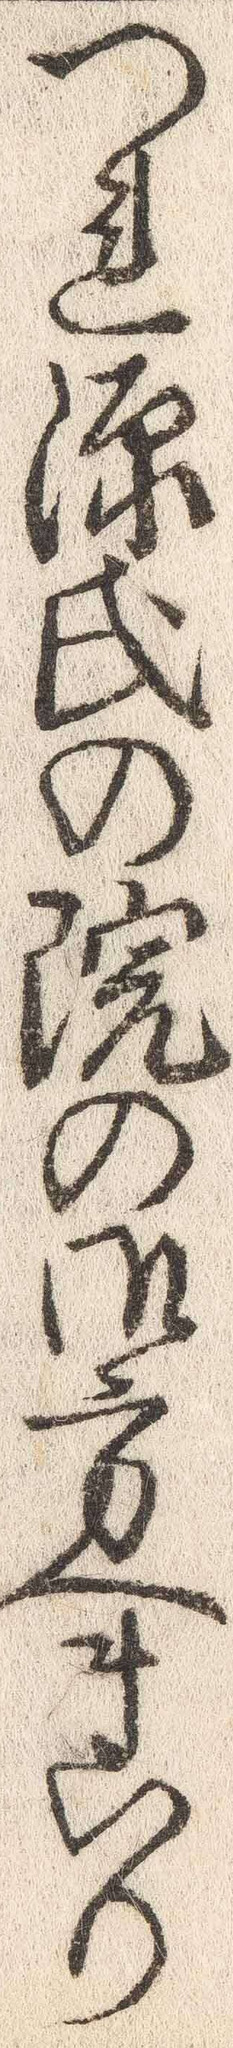つれ源氏の院の御方へまいり

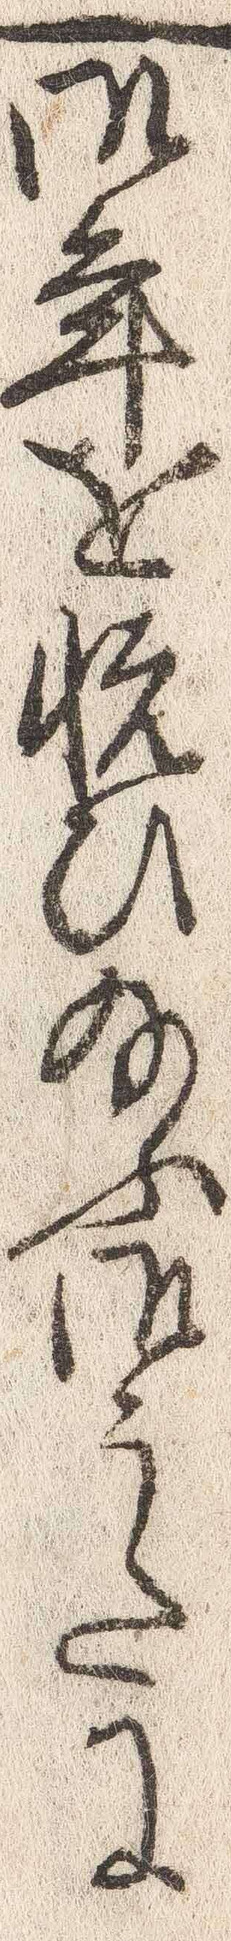御年を悦ひ給ふ御うたに
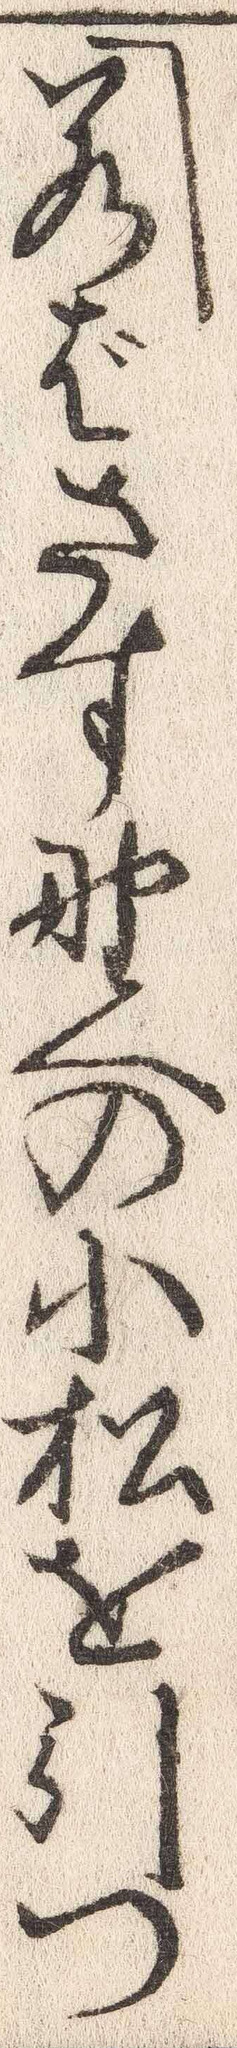〽若ばさす野への小松を引つ
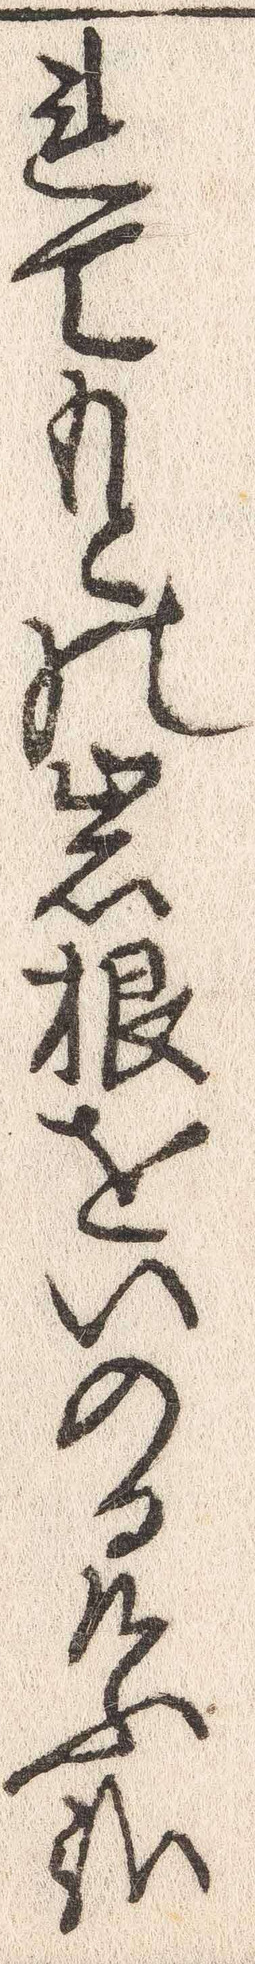れてもとの岩根をいのるけふ哉
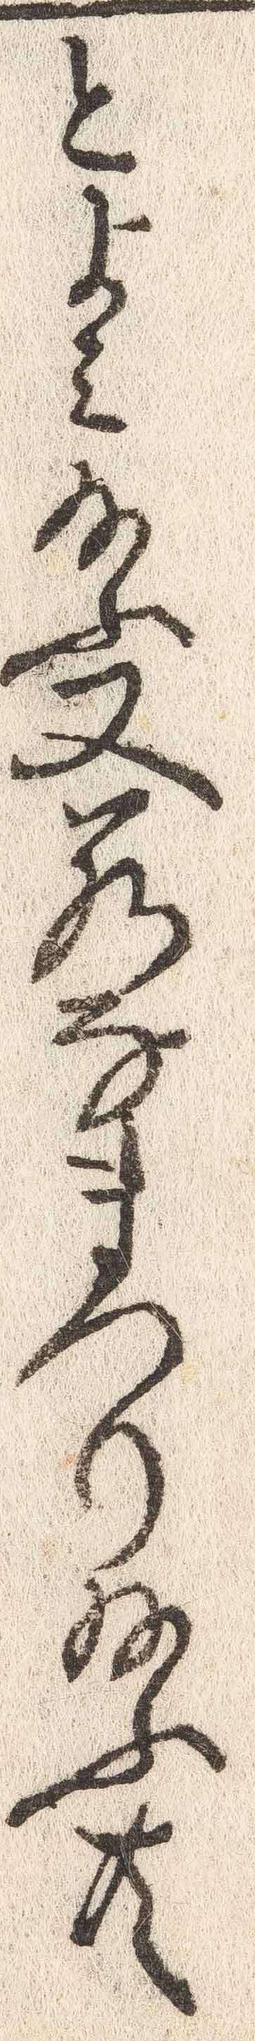とよみ給ふ又若なまつり給ふ共
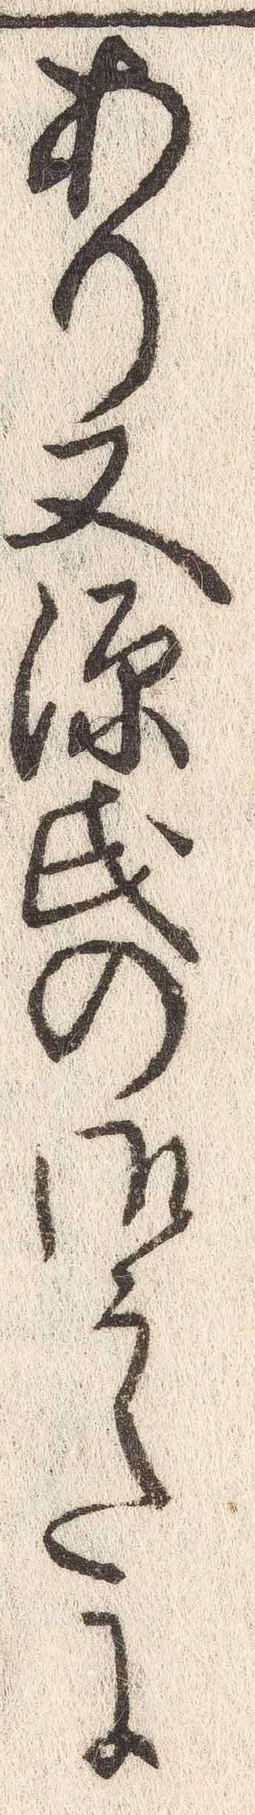あり又源氏の御うたに
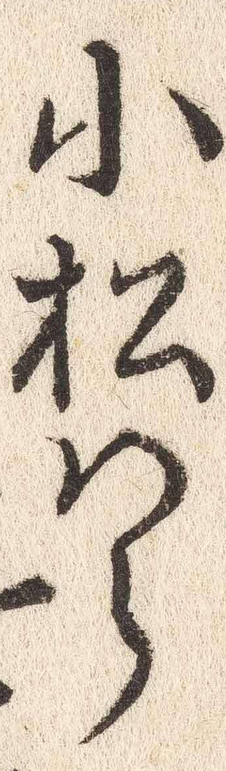小松はら
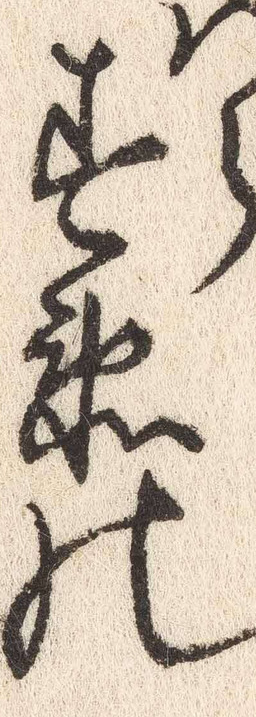すゑの
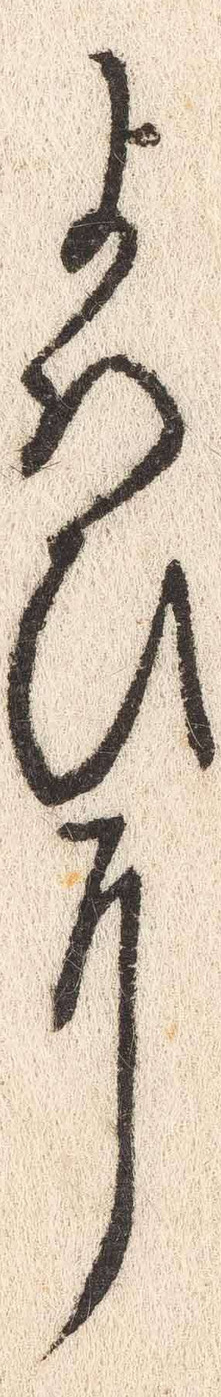よはひに
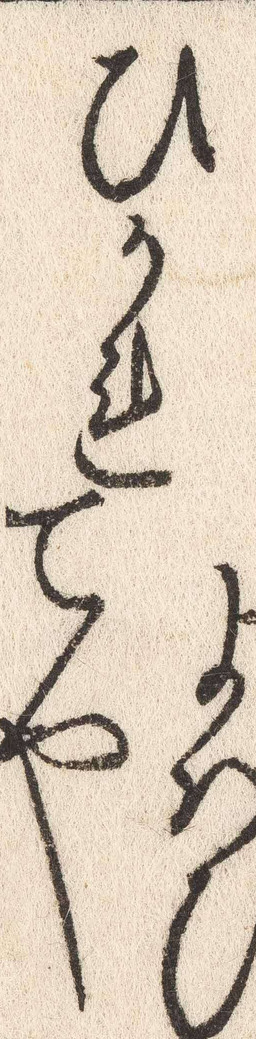ひかれてや
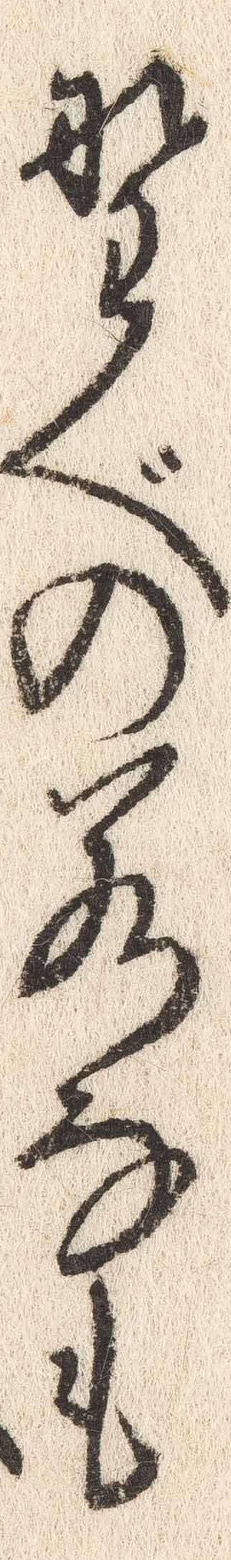野べの若なも
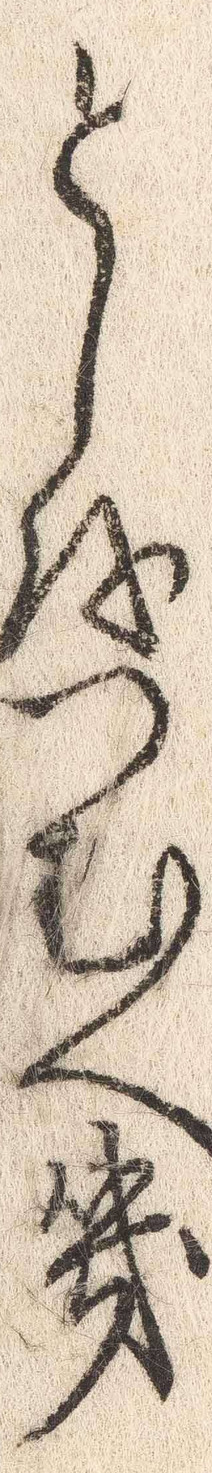としをつむへき

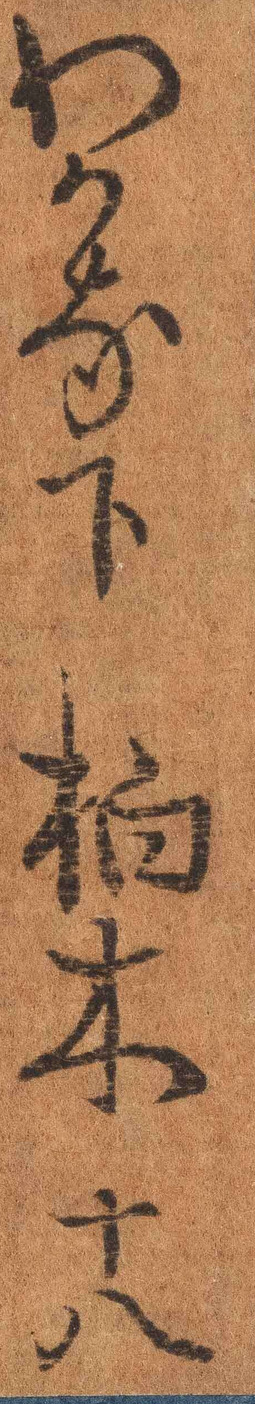わかな下柏木十八

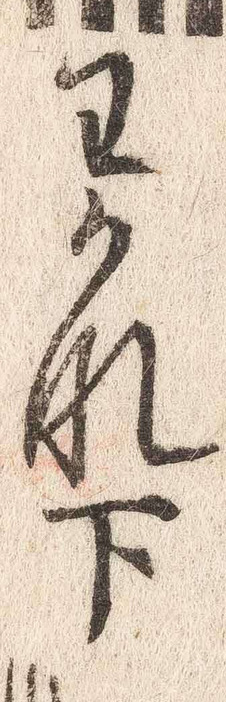わかな下

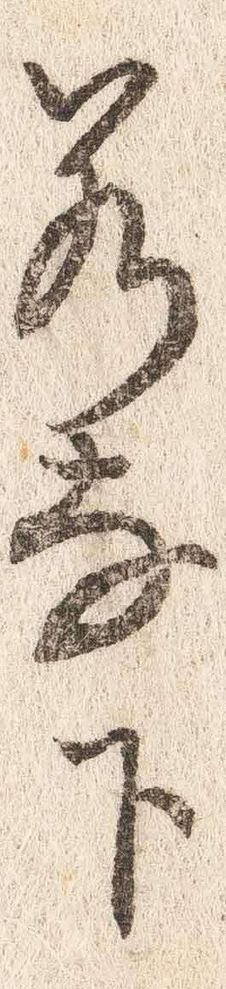若な下
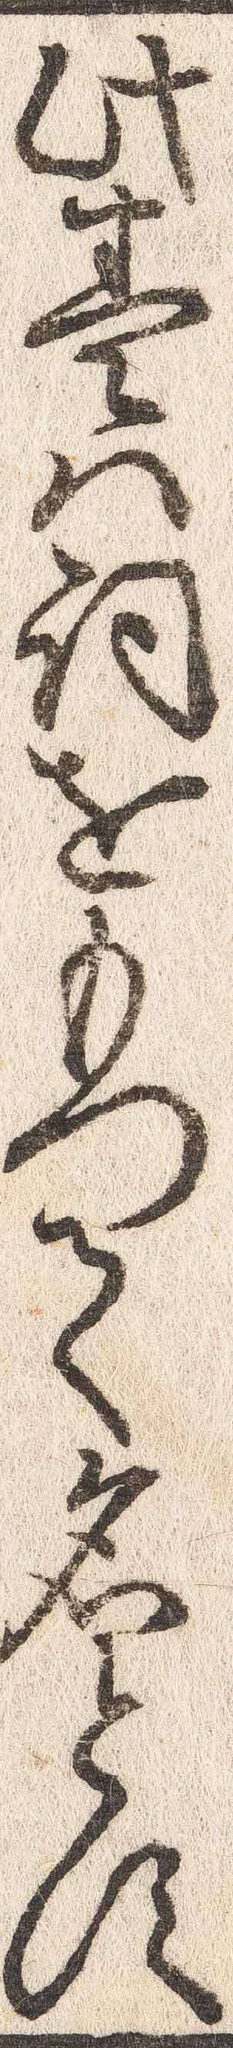此巻は詞をもつて名とす
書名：源氏物語
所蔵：東京学芸大学附属図書館 国文学研究資料館
